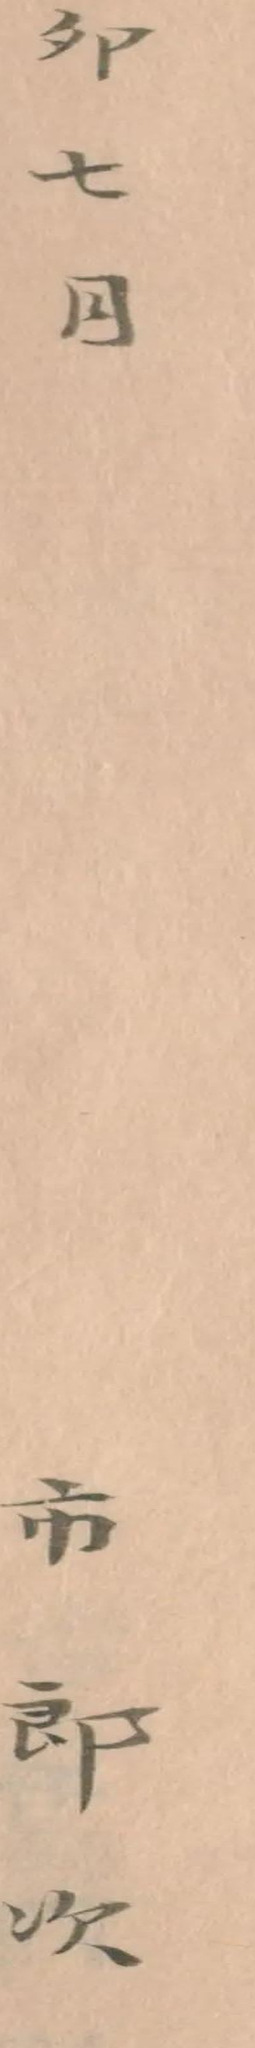卯七月市郎次
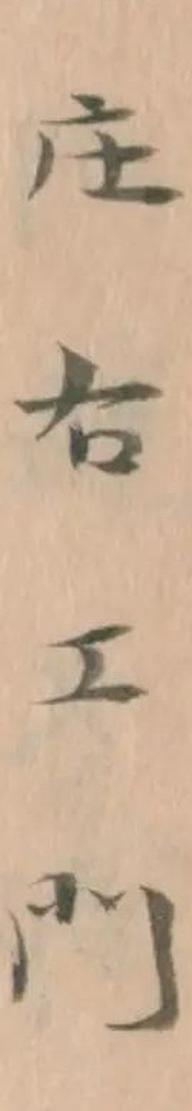庄右衛門

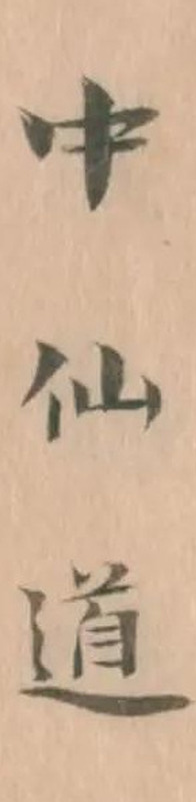中山道
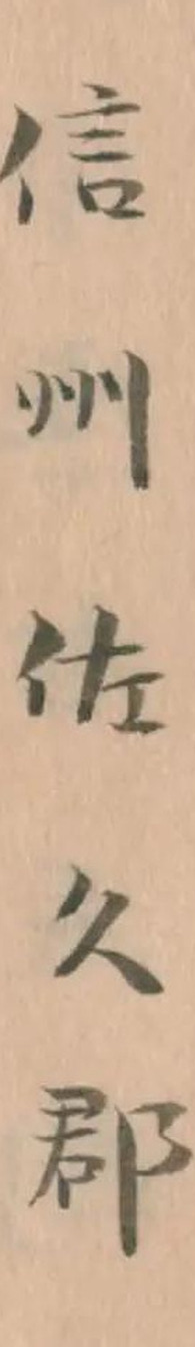信州佐久郡
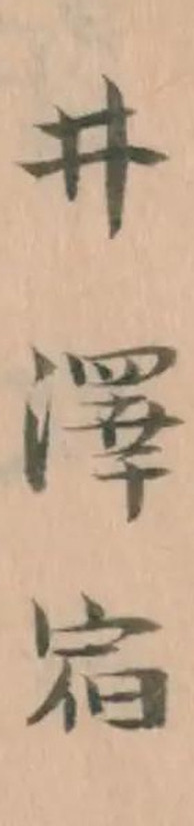井沢宿
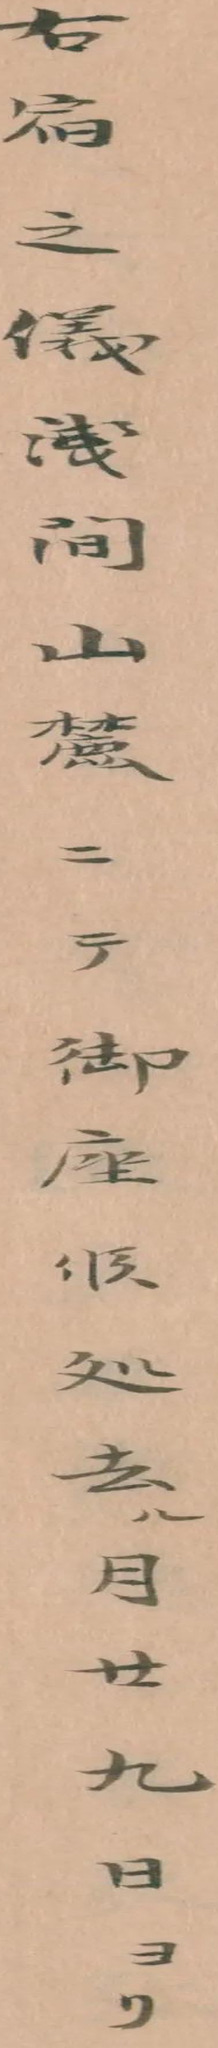右宿之儀浅間山麓二テ御座候処去ル月廿九日ヨリ
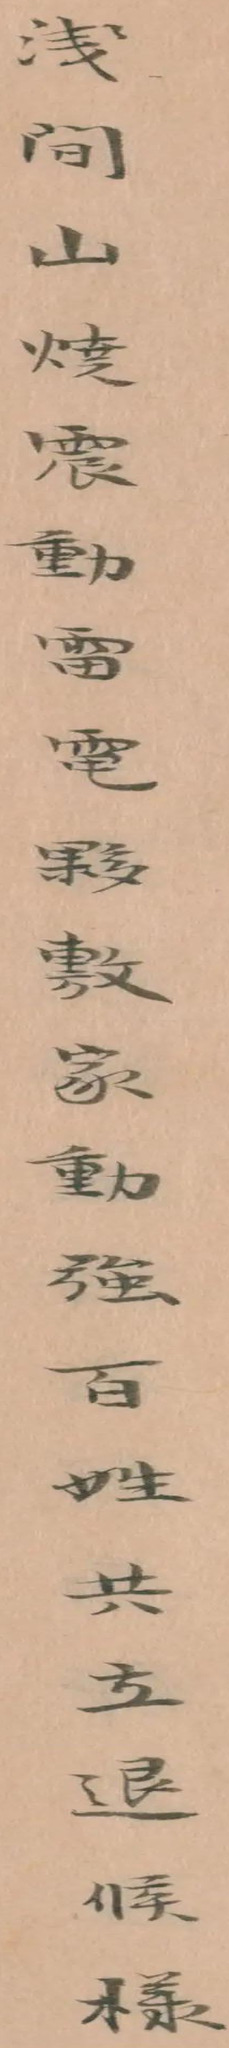浅間山焼震動雷電夥敷家動強百姓共立退候様
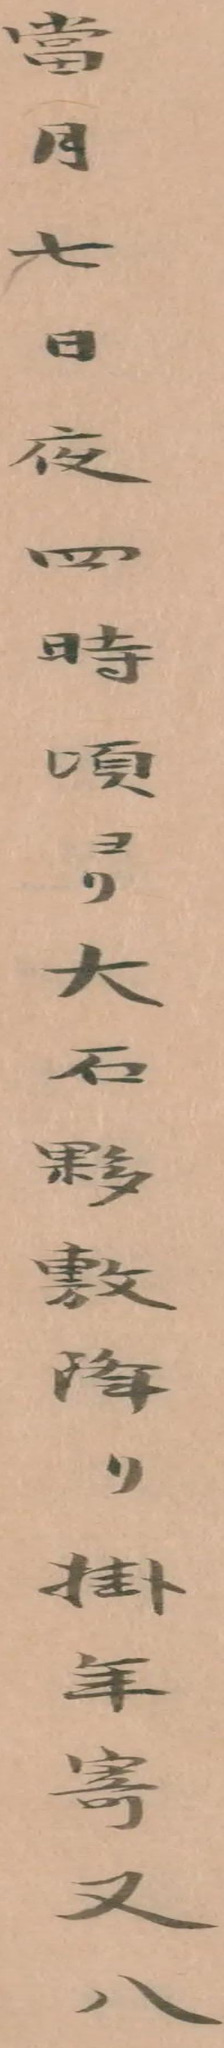当月七日夜四時頃ヨリ大石夥敷降り掛年寄又ハ
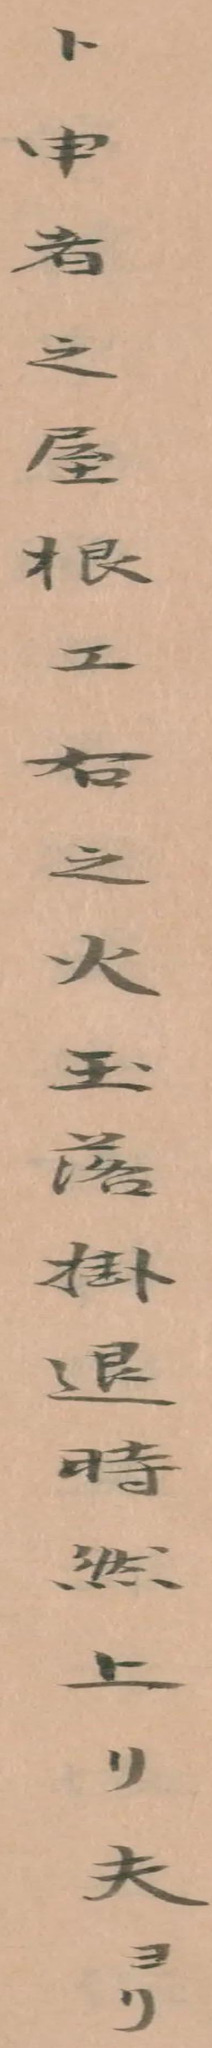ト申者之屋根エ右之火玉落掛退時燃上リ夫ヨリ
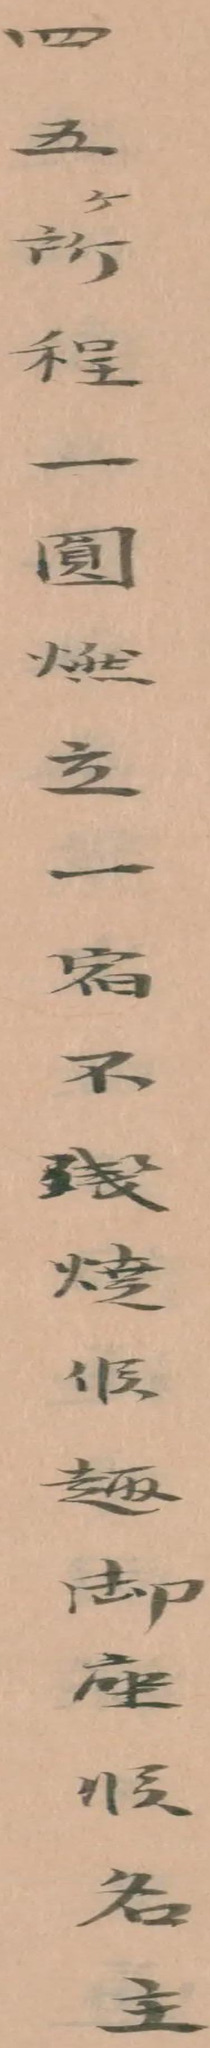四五ヶ所程一円燃立市宿不残焼候趣御座候名主
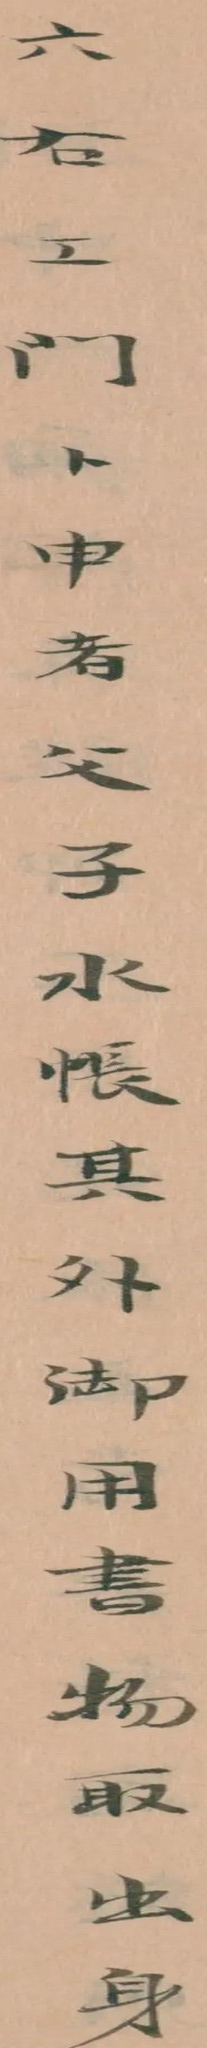六右衛門ト申者父子水帳其外御用書物取出身
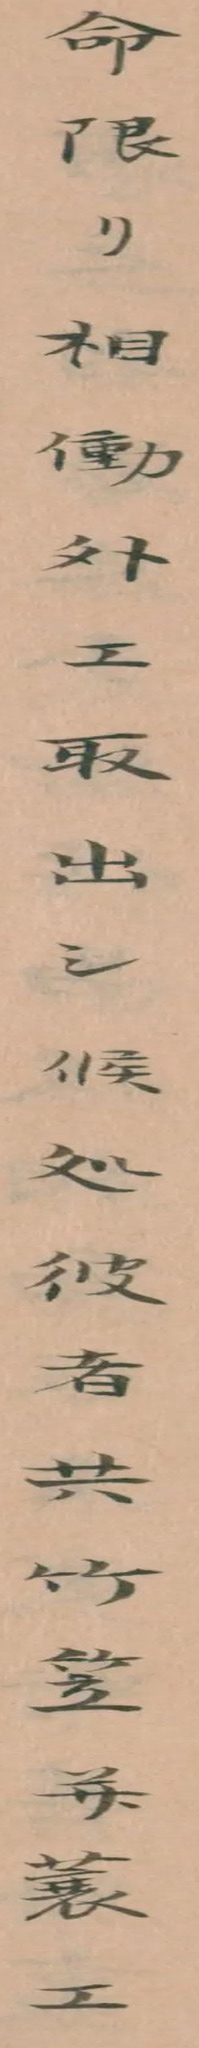命限り相働外エ取出シ候処彼者共竹笠并蓑エ
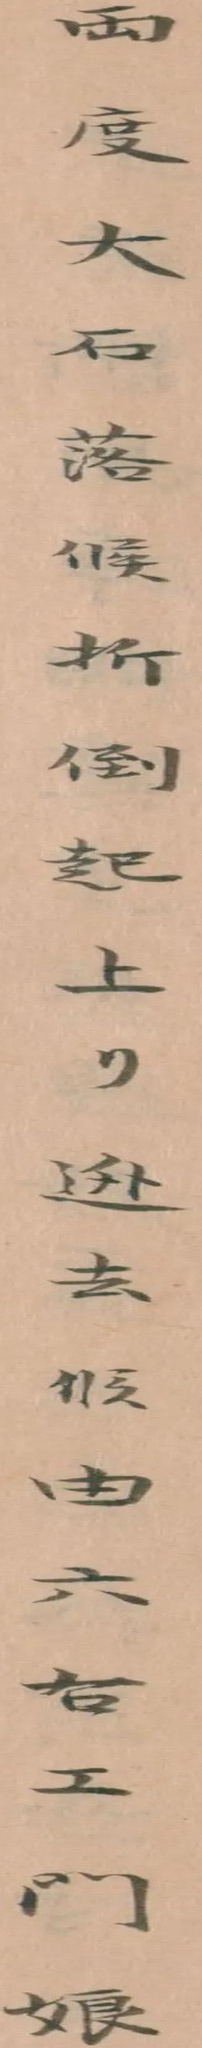両度大石落候折倒起上り逃去候由六右衛門娘
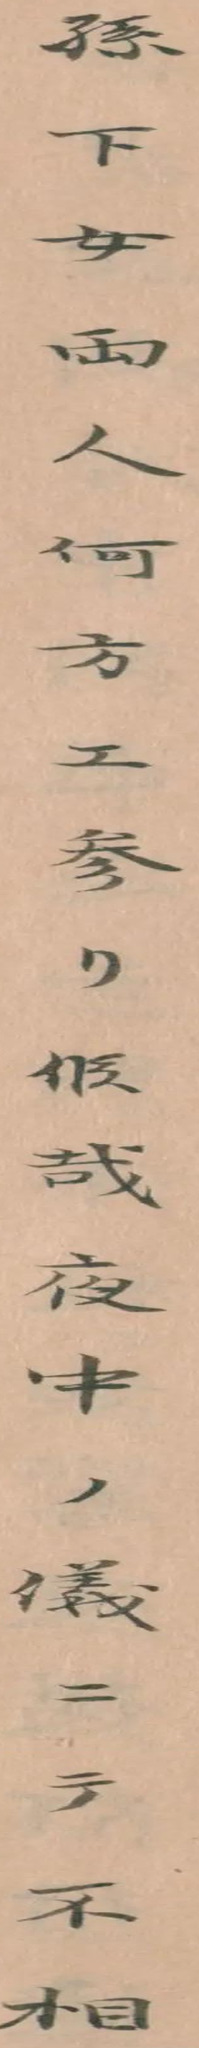孫下女両人何方エ参リ候哉夜中ノ儀ニテ不相
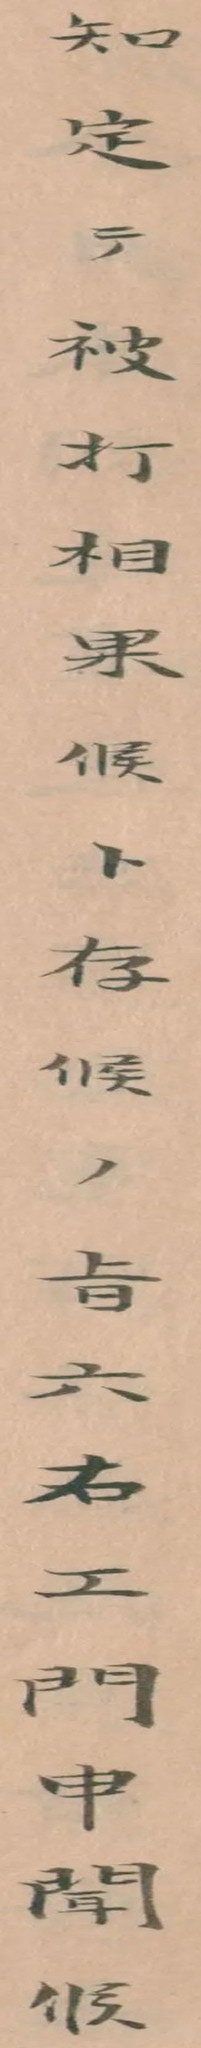知定テ被打相果候ト存候ノ旨六右衛門申聞候
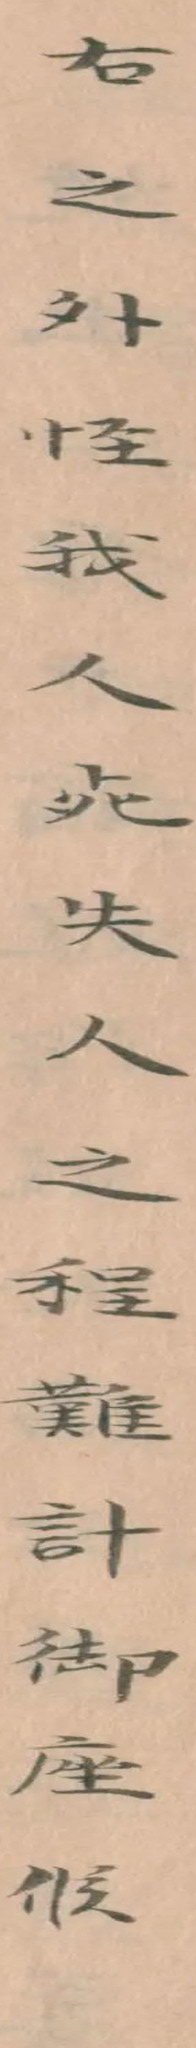右之外怪我人死失人之程難計御座候
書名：地災撮要. 巻1(噴火山・地震ノ部)
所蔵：国立国会図書館 National Diet Library, JAPAN
